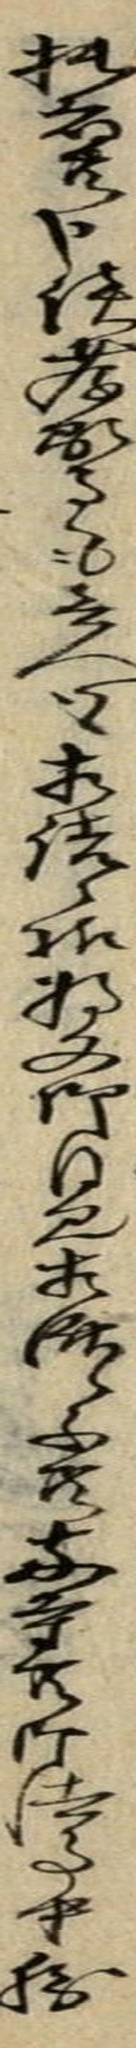拙者共申談孝顕寺へも壱人つゝ相詰候様猶又御目見相済候事共両寺共御法事中勝
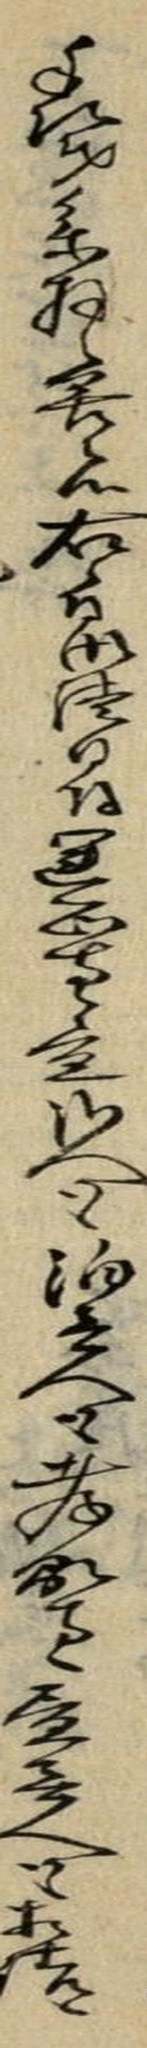手次第参拝候筈に候右に付御徒目付運正寺昼弐人つゝ泊壱人つゝ孝顕寺へ昼壱人つゝ相詰候
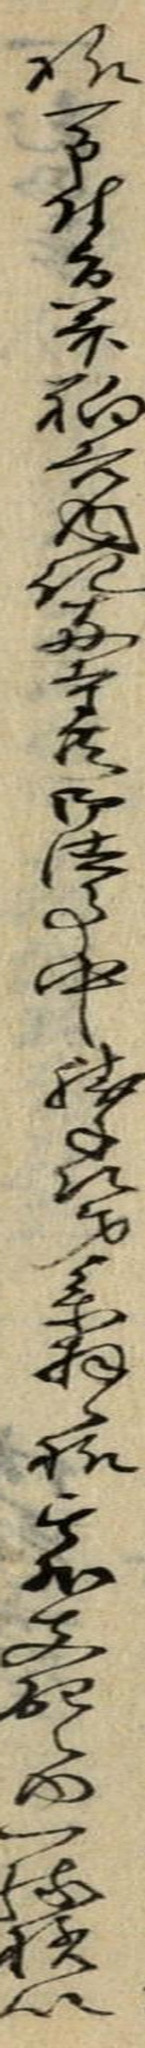様可申付旨并粕谷内記両寺共に御法事中勝手次第参拝候様其外支配之内一統格以
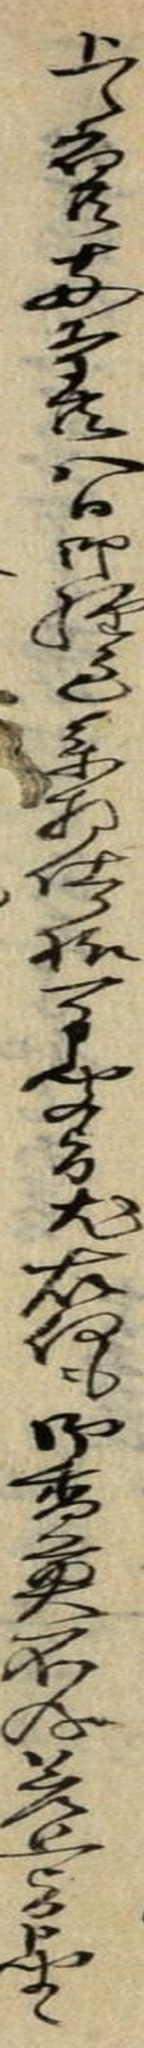上之者共両寺共八日御経過参拝仕候様可申聞候旨尤右何も御香典不及差上旨申聞候
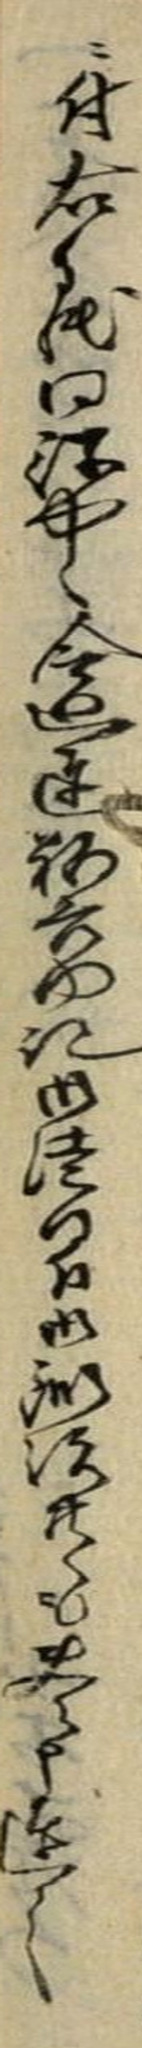に付右手紙同役中令通達粕谷内記御徒目付御側詰共へも申達之
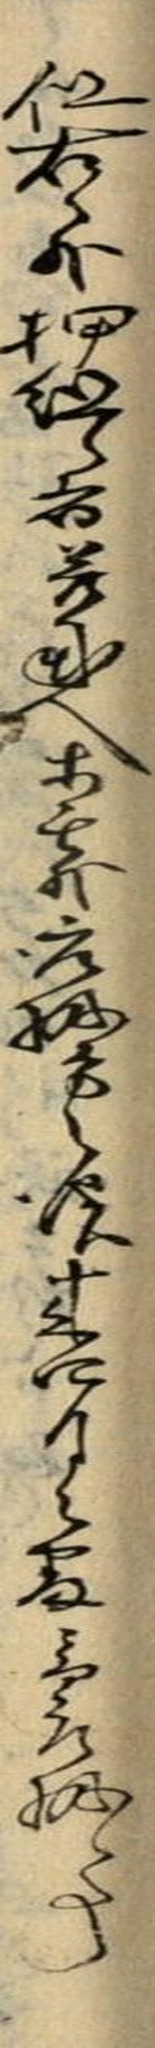但右之外押組之者并用人等其外取扱方之儀は来四月之番に而取扱候事
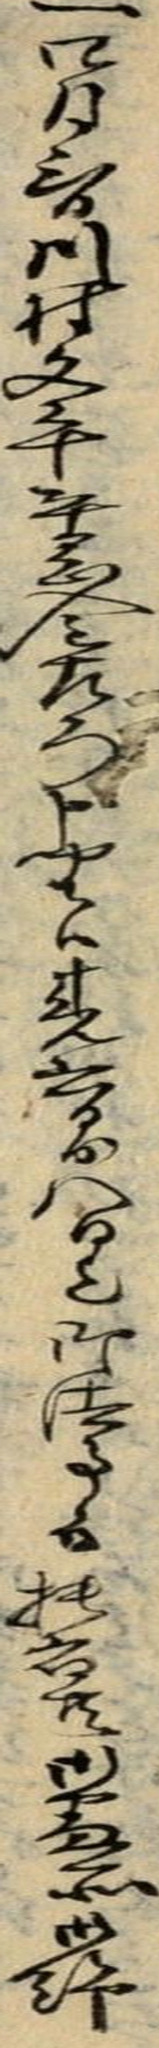一四月三日川村文平平岡金左衛門申聞候は来る六日ゟ八日迄御法事に付拙者共御番所御飾
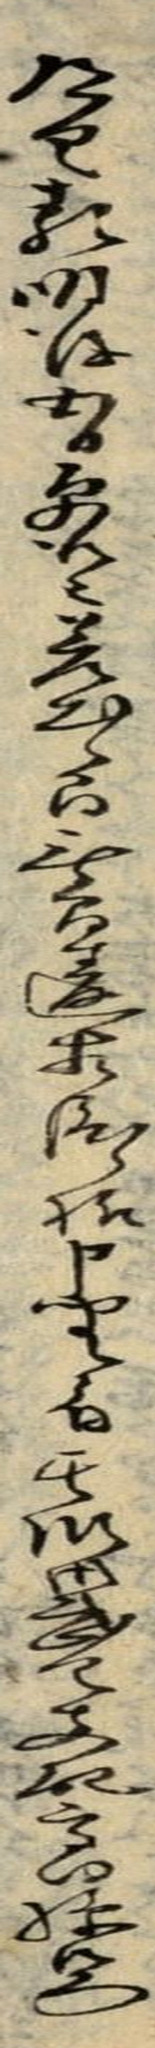道具類明後五日受取に差出候間無間違相渡候様申聞候に付其段御武具支配高田孫左衛門
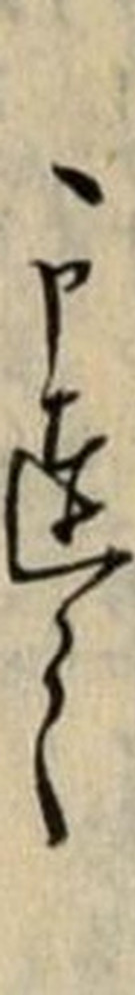へ申達之
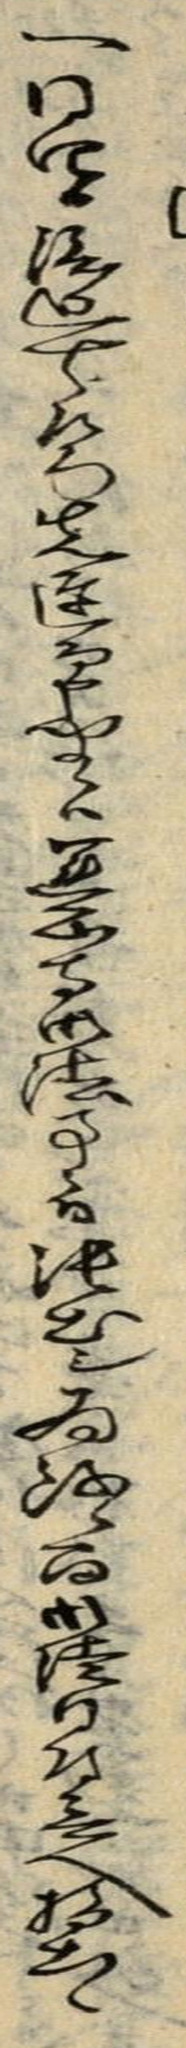一同四日渡辺十郎左衛門先達而申聞候は運正寺御法事に付張出し為致候間御徒目付壱人指出候
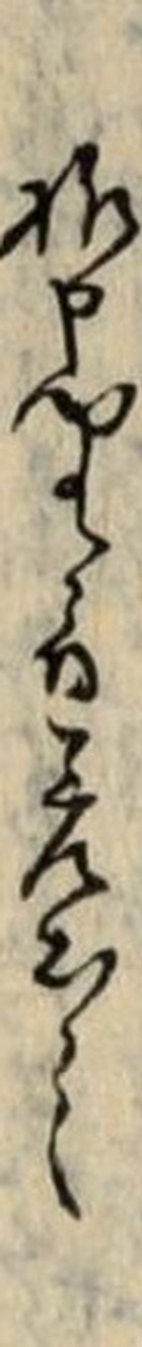様申聞候付差出之
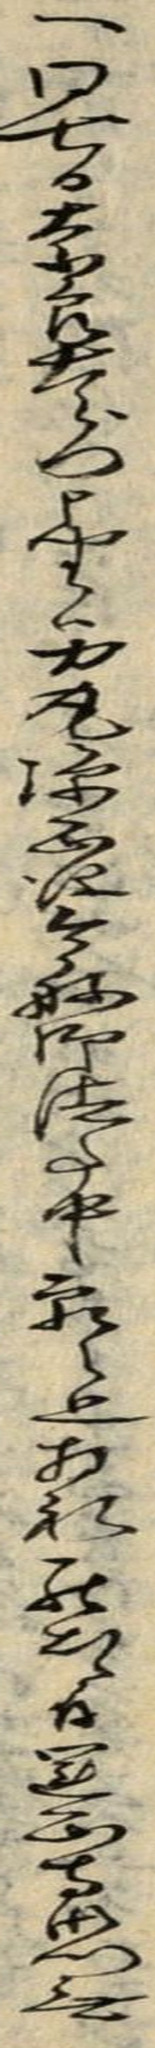一同七日奈良太郎右衛門申聞候は力丸源正儀今般御法事中願之上拝礼罷出候に付運正寺御門無
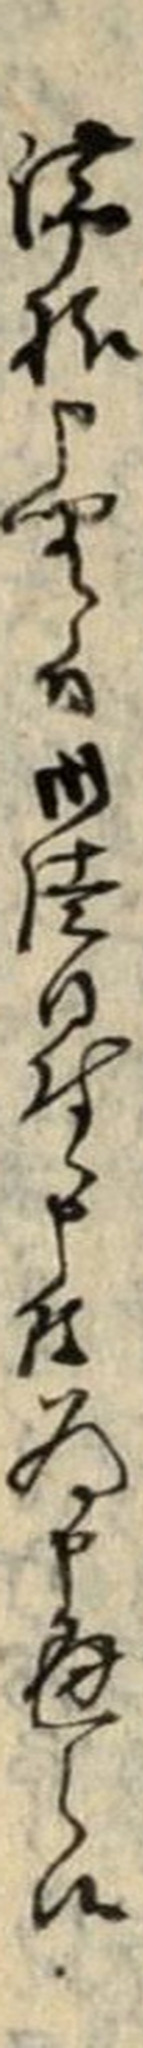滞候様申聞候に付御徒目付へ申付為申通し候
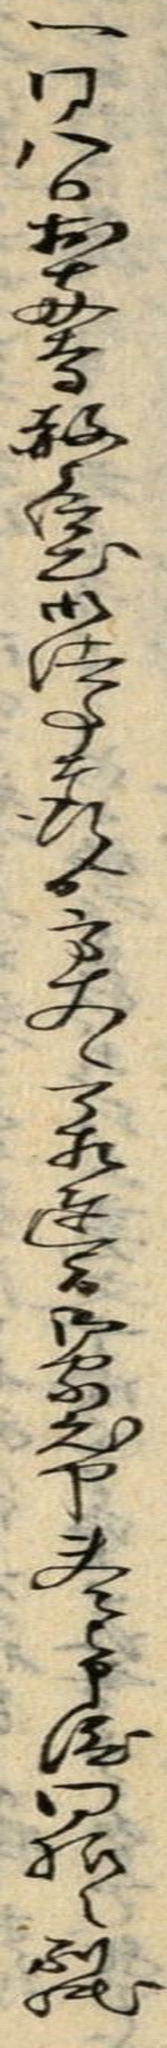一同八日於両寺赦被仰出御法事奉行ゟ方丈へ可相達候旨御家老中夫々申渡同様之別紙
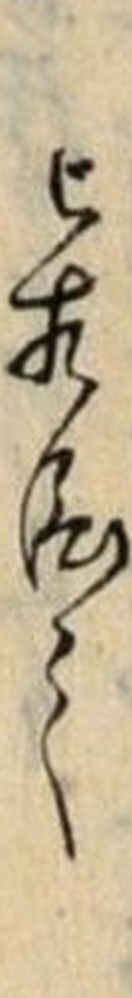被相渡之
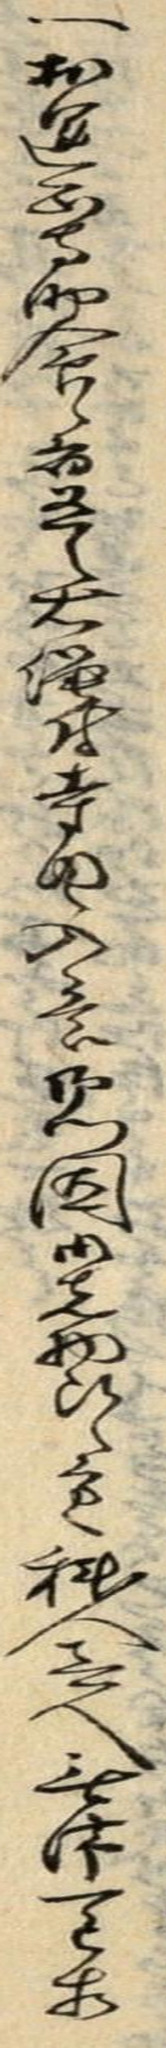一於運正寺助命之者有之右縄付寺内へ入候節御門固御先物頭之方へ科人壱人無滞可被相
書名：蒐輯之部
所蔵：福井県文書館 Fukui Prefectural Archives
